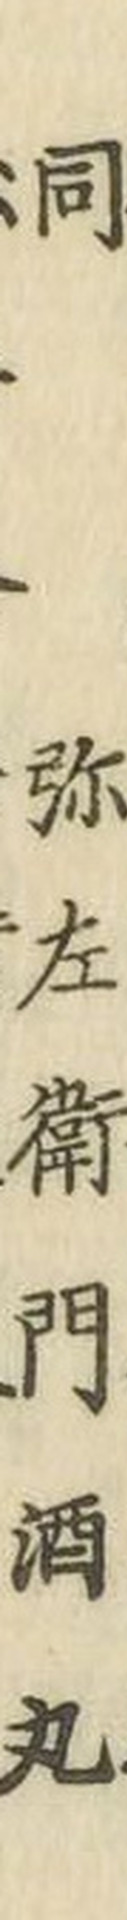同弥左衛門酒丸
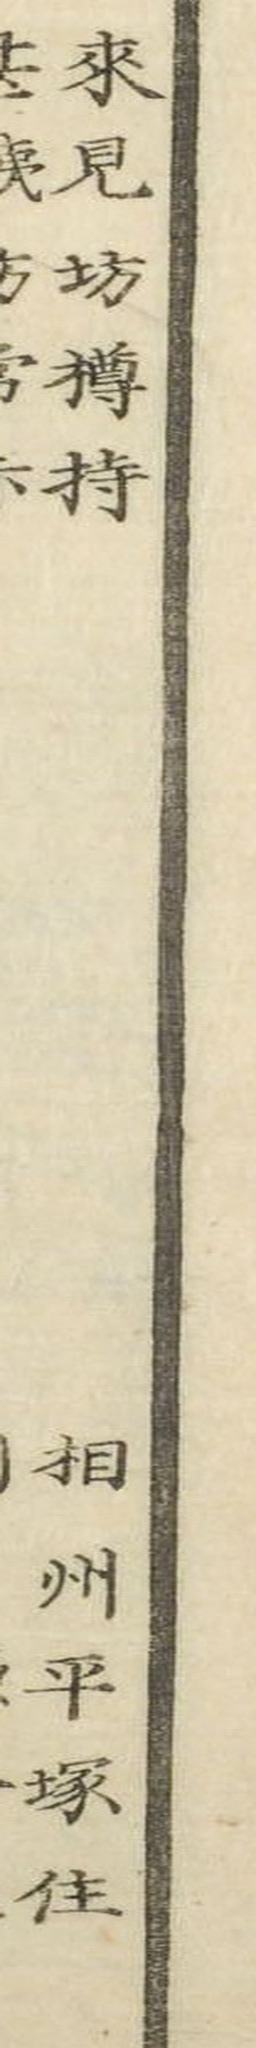來見坊樽持相州平塚住
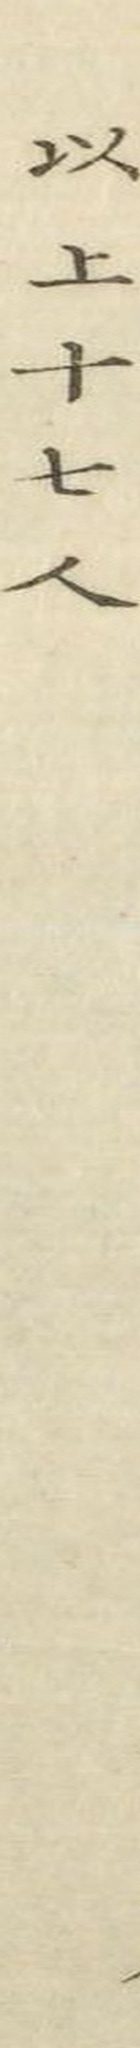以上十七人
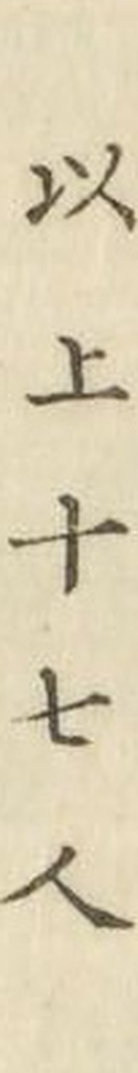以上十七人
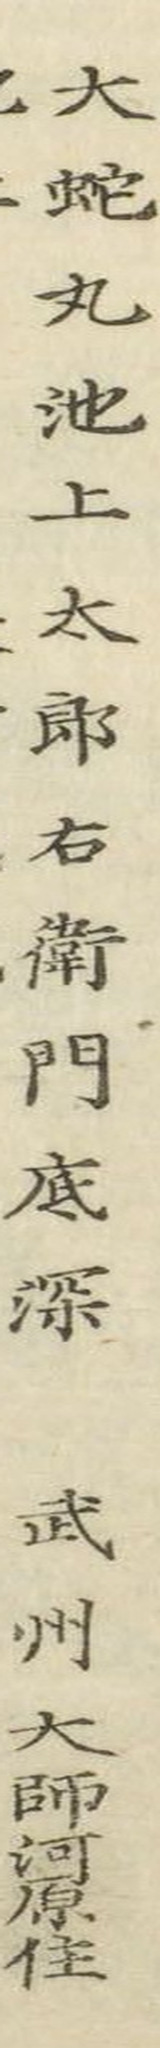大蛇丸池上太郎右衛門底深武州大師河原住
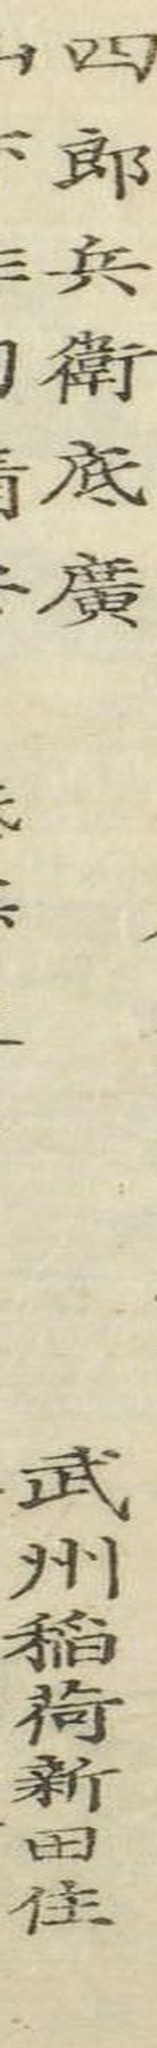四郎兵衛底廣武州稲荷新田住
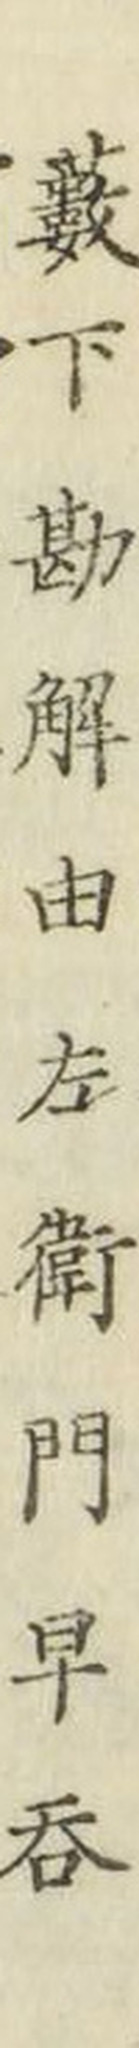藪下勘解由左衛門早呑
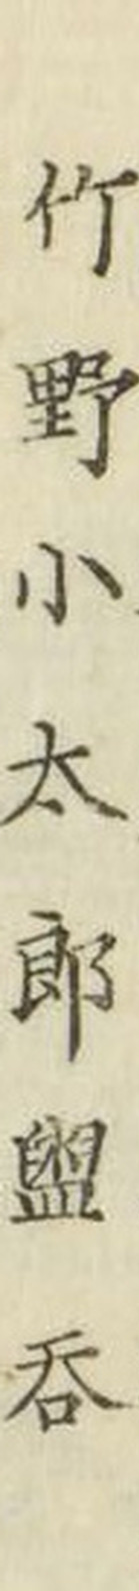竹野小太郎盥呑
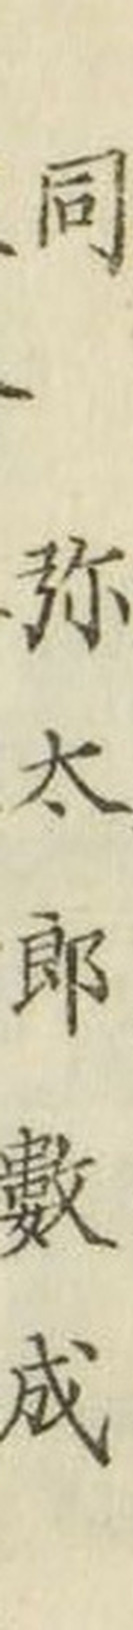同弥太郎數成
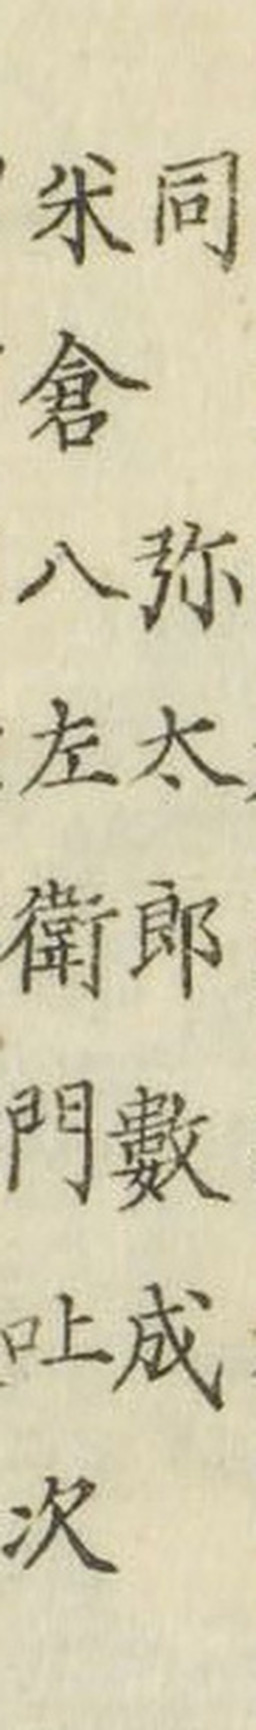米倉八左衛門吐次
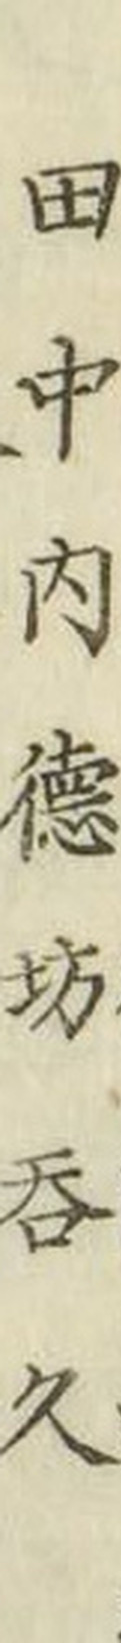田中内德坊呑久
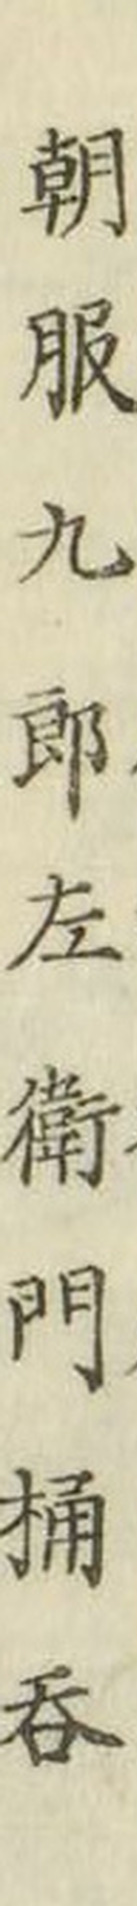朝服九郎左衛門桶呑
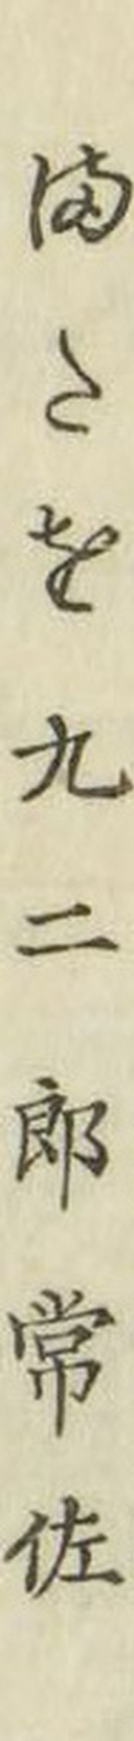またを九二郎常佐
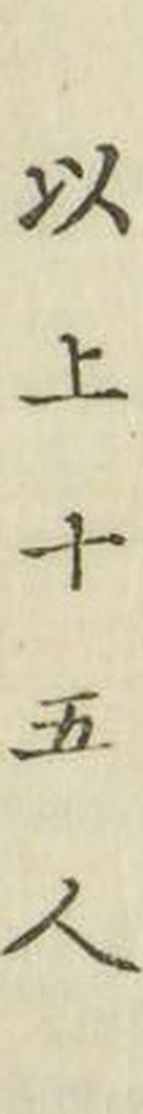以上十五人
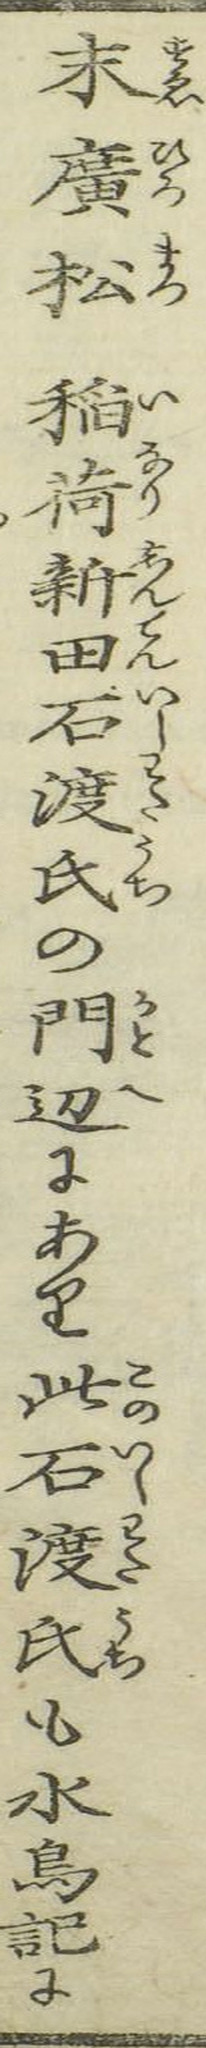末廣松稲荷新田石渡氏の門辺にあり此石渡氏も水鳥記に
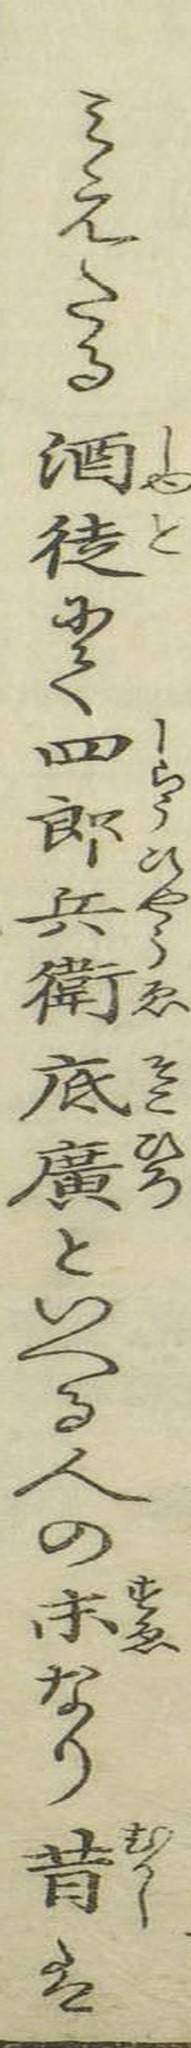みえたる酒徒にて四郎兵衛底廣といへる人の末なり昔は
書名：江戸名所図会 20巻 巻之5
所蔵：東京学芸大学教育コンテンツアーカイブ
